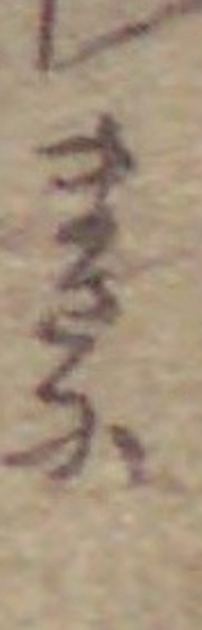まさに
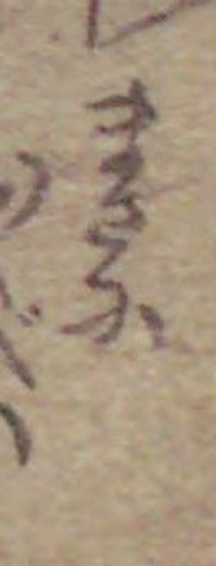まさに
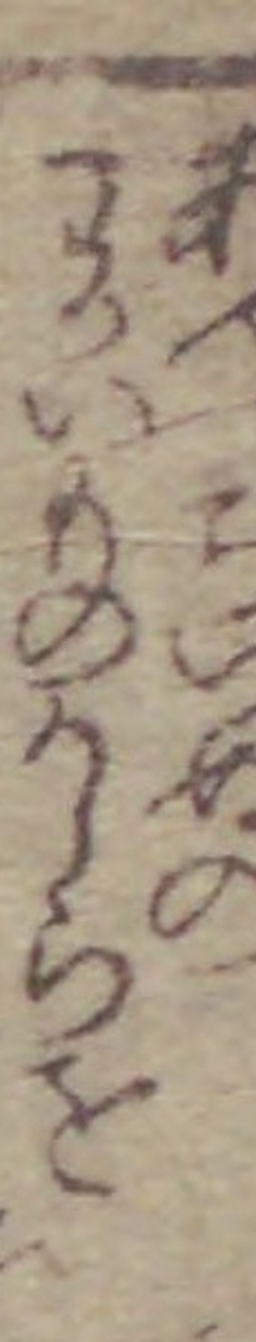わかいものかしらを
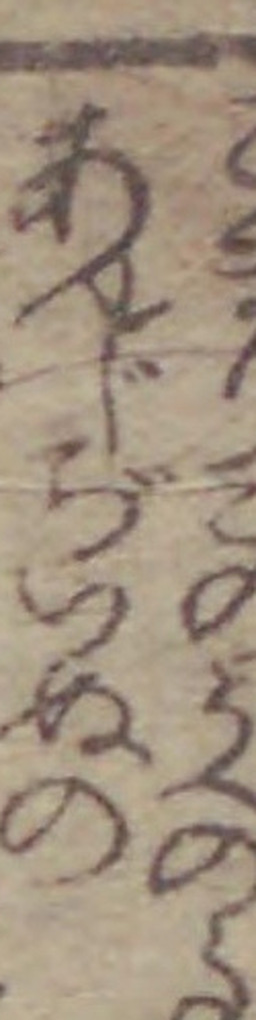あんじぢいぬの
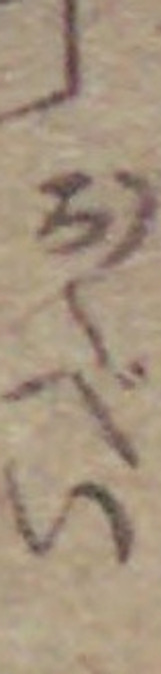おゝべい
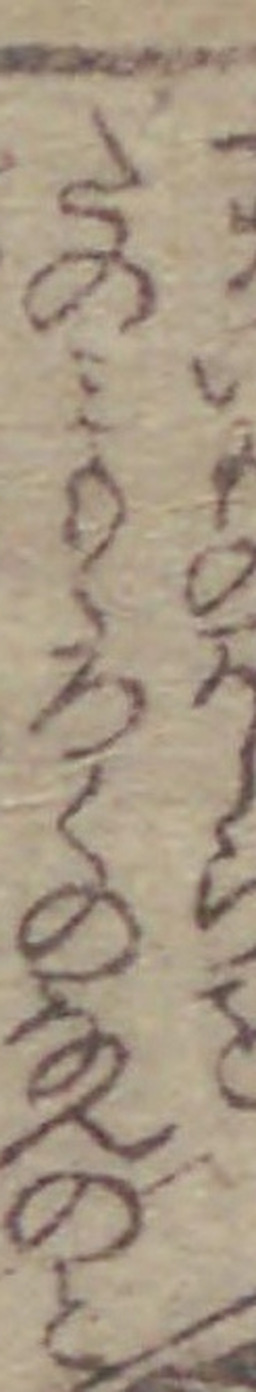たのみもくろくのなんのと
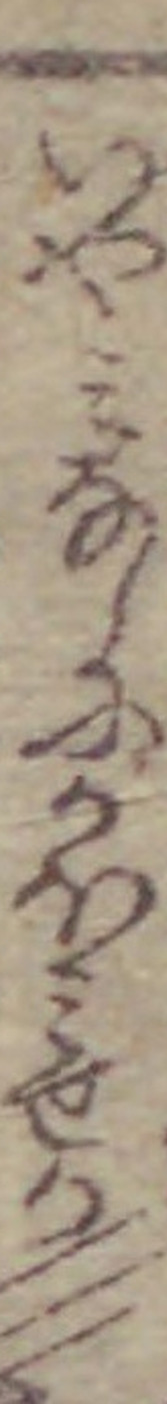いやみなしにかほみせか
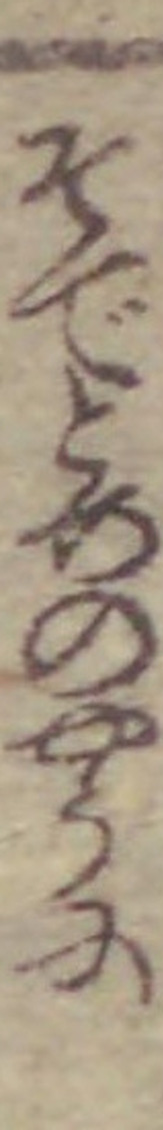そでとめのやうに
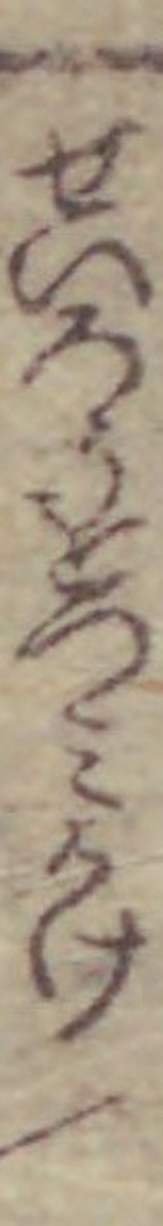せいろうをつみかけ
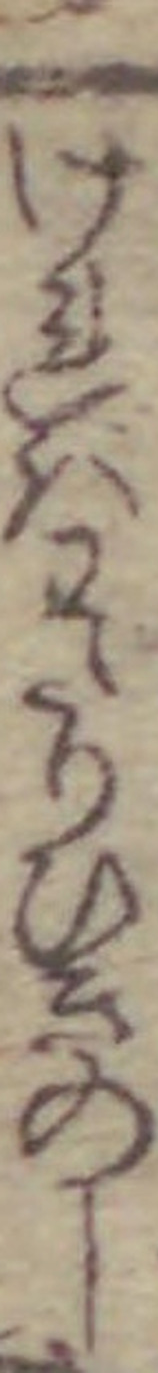ければわたりひきの
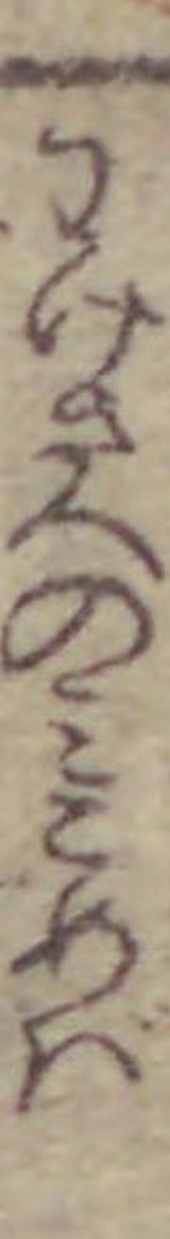わけさへのみこめば
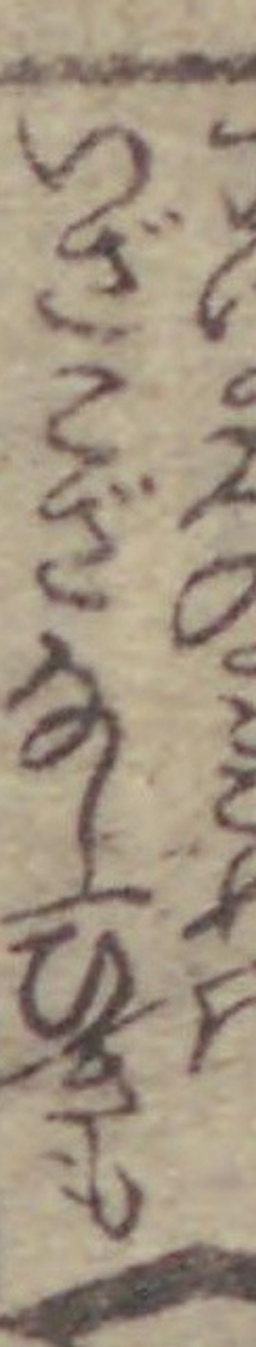いざこざなし一ひきも
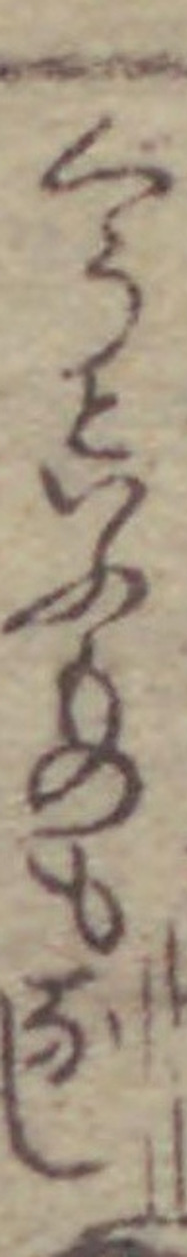ぐうといふものもなし
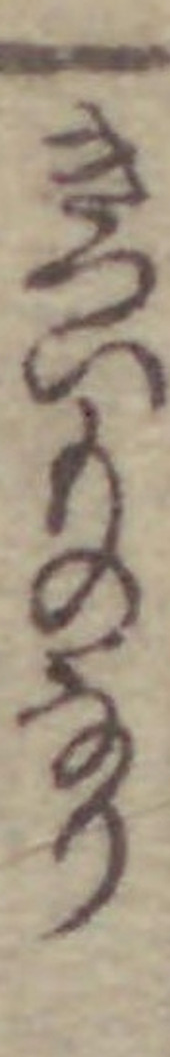きついものなり
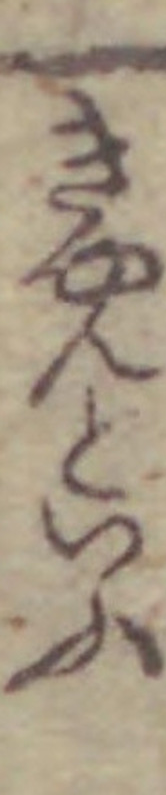きやんといふ
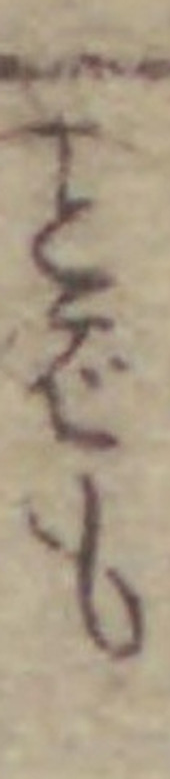ことばも
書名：狆の嫁入 2巻
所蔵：国立国会図書館 National Diet Library, JAPAN
